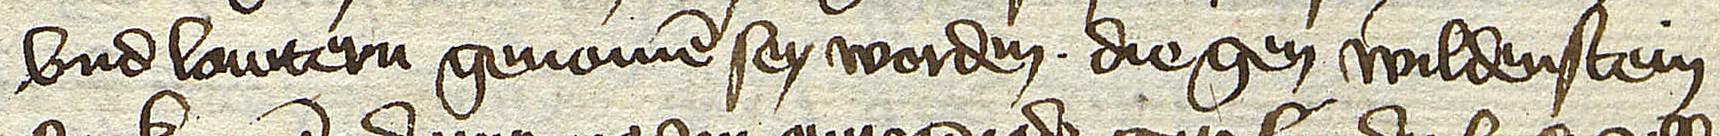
vnd lawtern genome* ſey worden . die gen wildenſtein
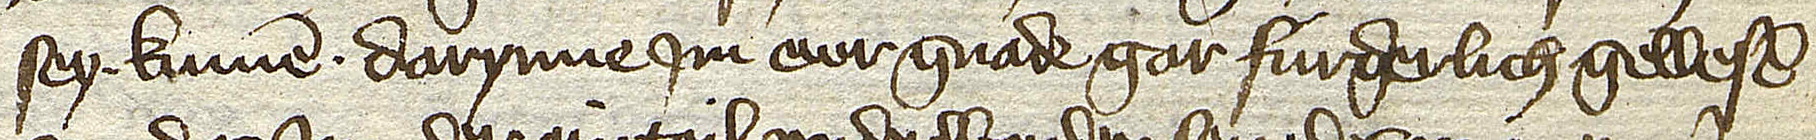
ſey kume* . darynne Im ewr gnade gar fürderlich geweſe*
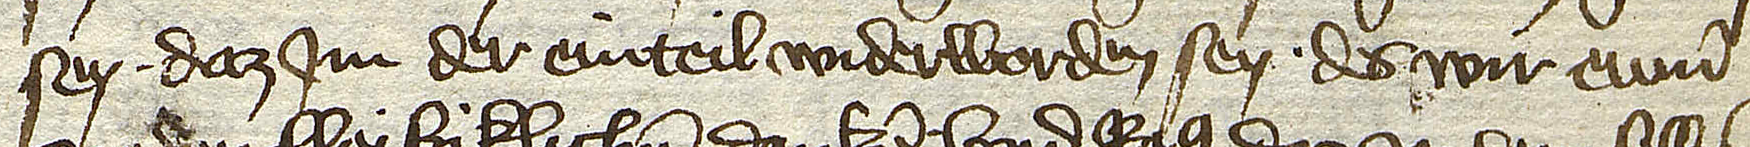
ſey . daʒ Im der einteil widerworden ſey . des wir ew*n
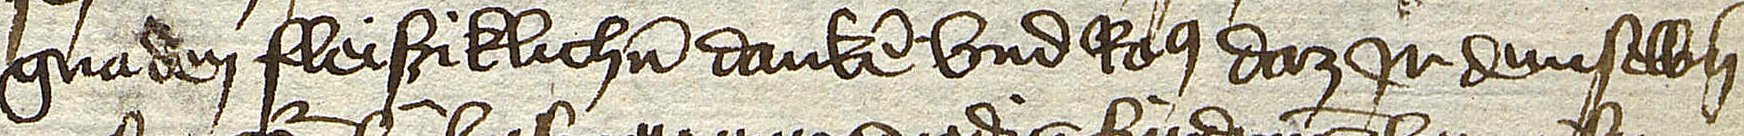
gnaden fleiſʒiklich*n danke* vnd Ro* daʒ Ir demſelb*n
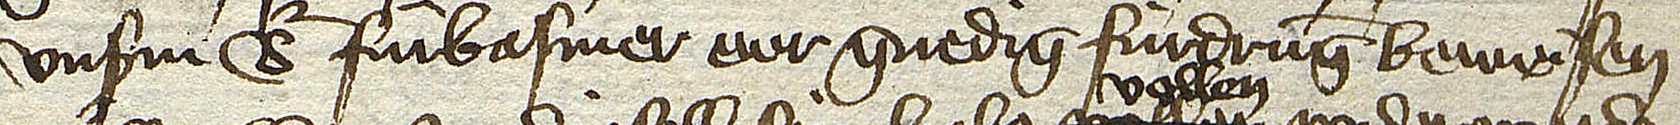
vnſ*m B* fürbaſmer ewr gnedig fürdru*g beweiſen
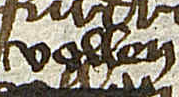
vollen
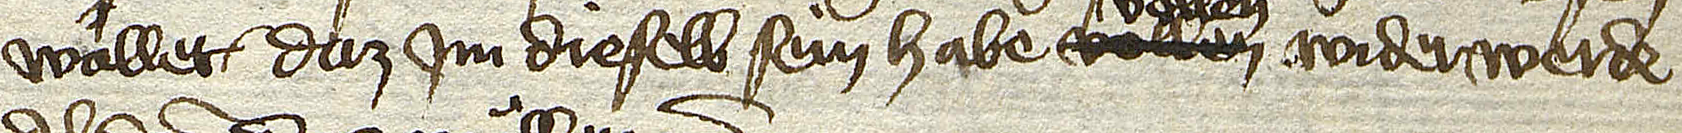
wöllet / daʒ Im dieſelb ſein habe vollen wider werde
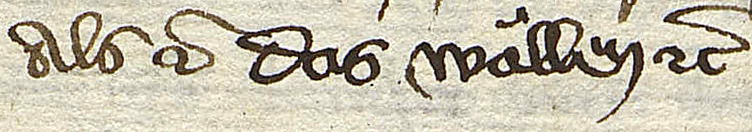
Als ec* das wöllen ec*
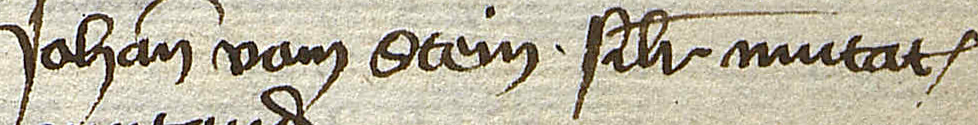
Iohan* von Stein . ſilr* mutat*
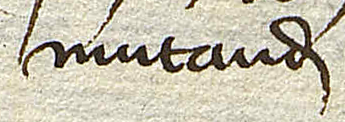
mutand*
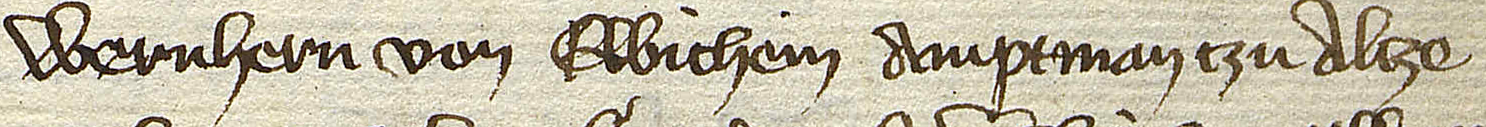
Wernhern von Elbichein Amptman cʒu Alcʒe
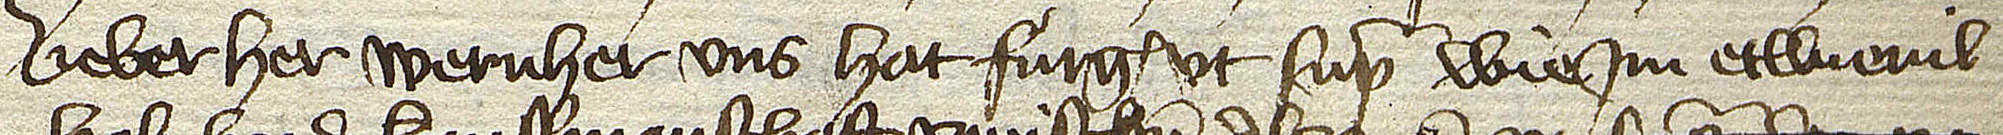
Lieber her wernher vns hat fürg* vt ſup* wie Im etwievuil
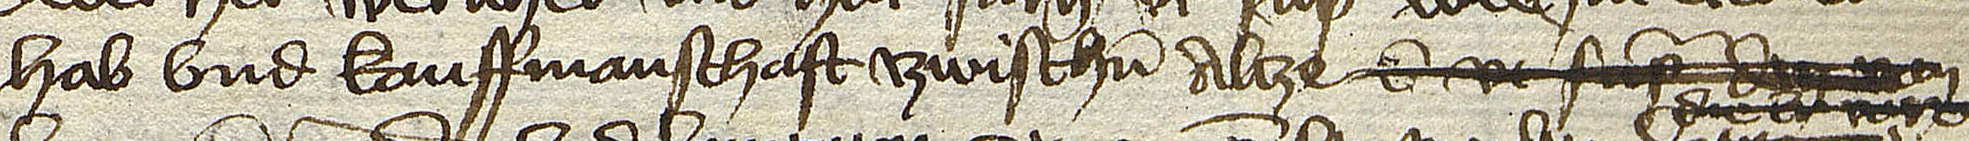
hab vnd kauffmanſchaft cʒwiſch*n Alcʒe ec* vt ſup* den von
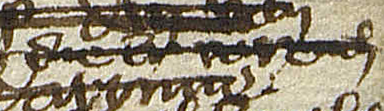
die Er vor euch
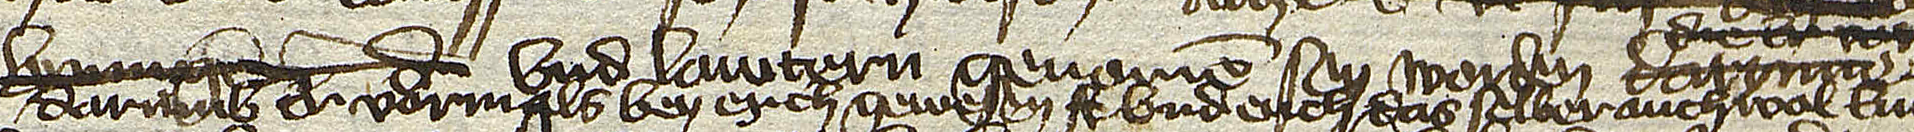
lyninge* ec* d vnd lawtern genome* ſey worden darynne
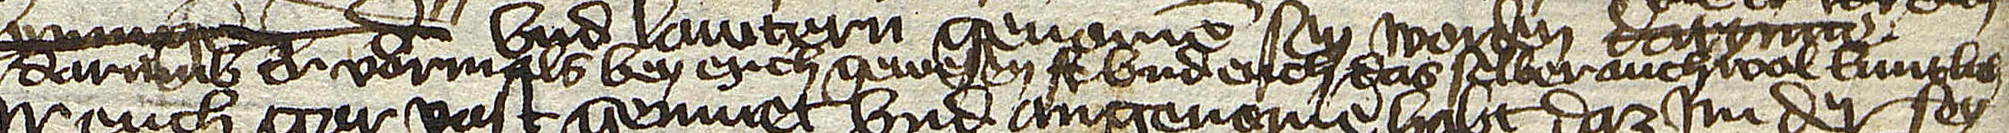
darumb Er vormals bey euch geweſen vnd euch das ſelber auch wol kuntlich
